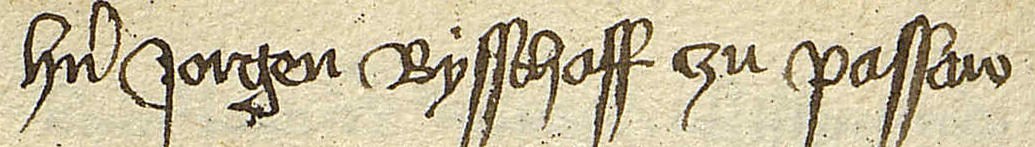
hn* Iorgen Byſſchoff cʒu Paſſaw
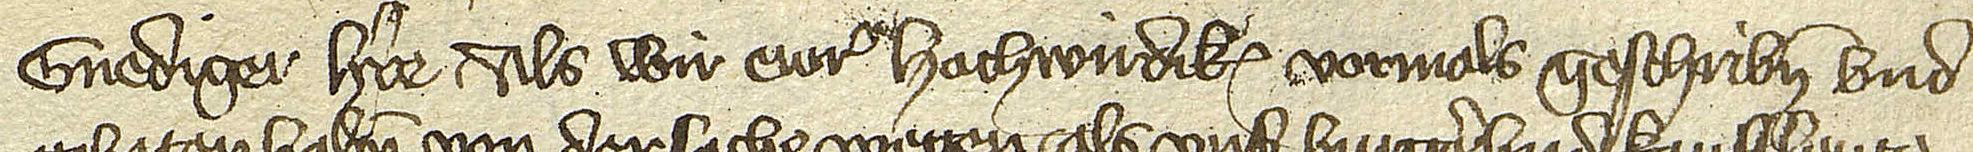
Gnediger h*re / Als wir ewr* hochwirdik* vormals geſchribn* vnd
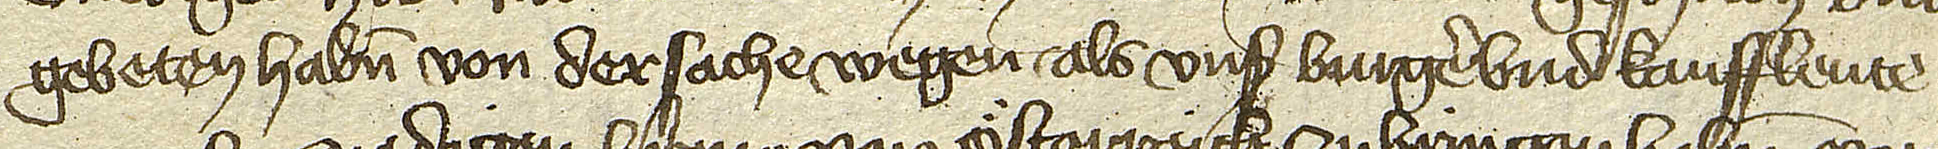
gebeten habn* von der ſache wegen / als vnſ* burge* vnd kauffleute
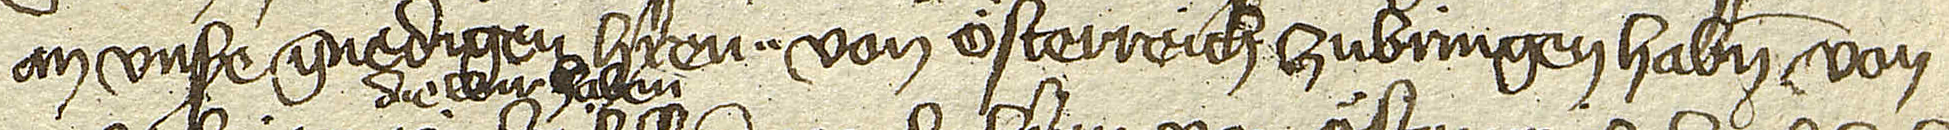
an vnſ*e gnedigen h*ren ~ von Öſterreich cʒubringen habn* / von
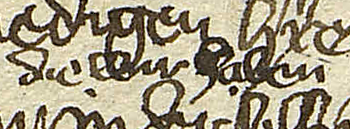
die wir haben
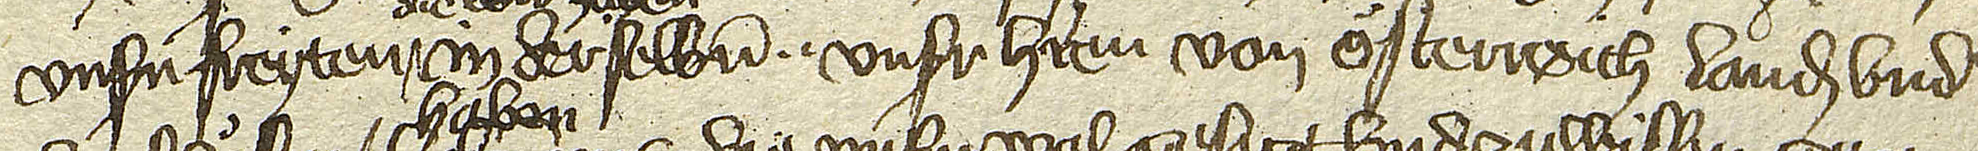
vnſ*n freyten in derſelbn* ~ vnſ*r h*ren von Öſterreich Land vnd
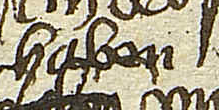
haben
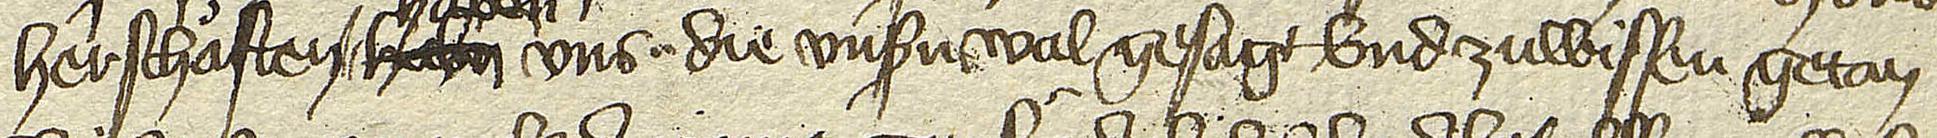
herſchäften habn* vns ~ die vnſ*n wol geſagt vnd ʒuwiſſen getan
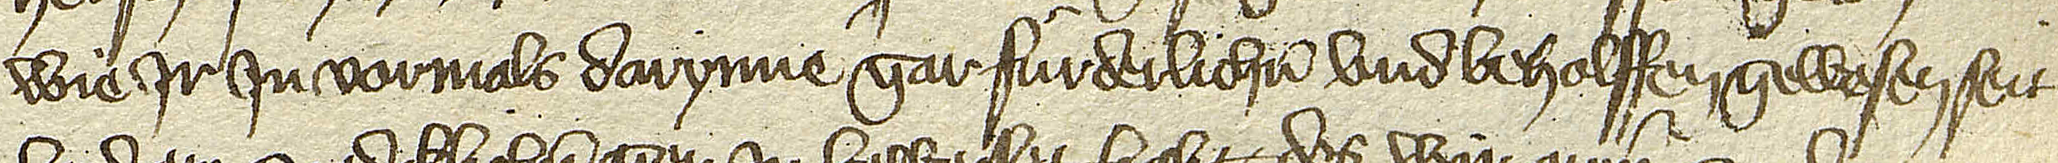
wie Ir In vormals darynne gar fürderlichn* vnd beholffen geweſen ſeit
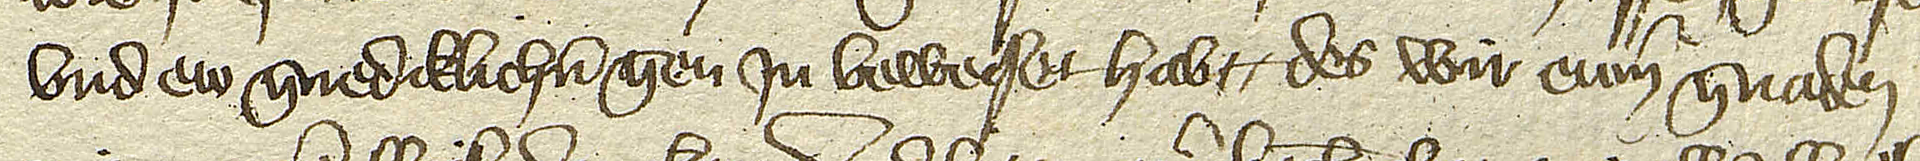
vnd ew gnediklichn* gen In beweiſet habt / des wir ewn* gnaden
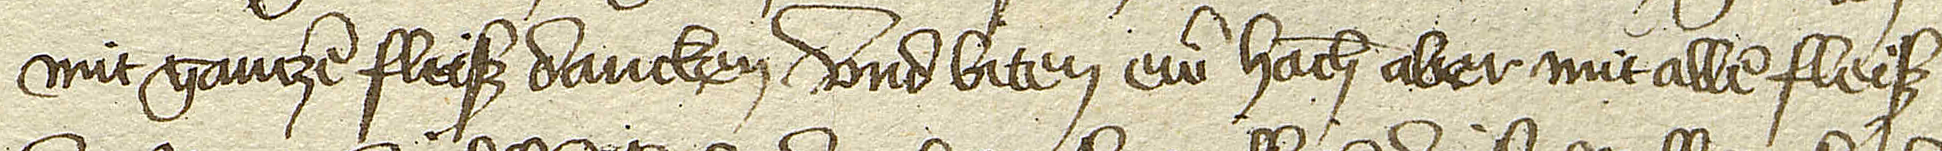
mit gancʒe* fleiſʒ dancken / Vnd biten ew* hoch* aber mit alle* fleiſʒ
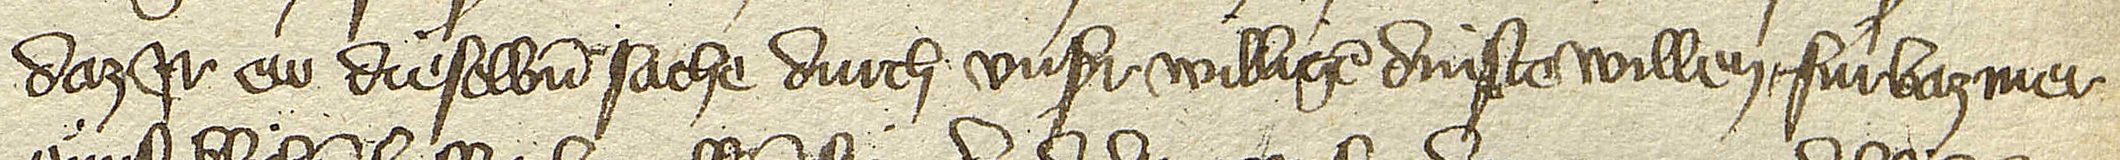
daʒ Ir ew dieſelbn* ſache durch vnſ*r willige* dinſte willen / fürbaʒ mer
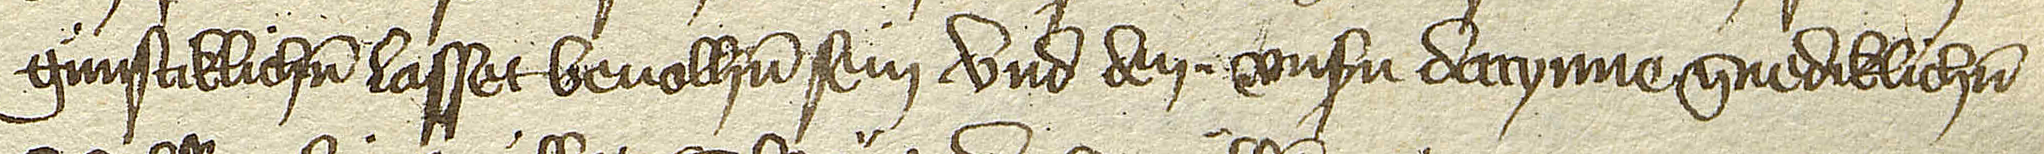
günſtiklichn* laſſet beuolhn* ſein / vnd den ~ vnſ*n darynne gnediklichn*
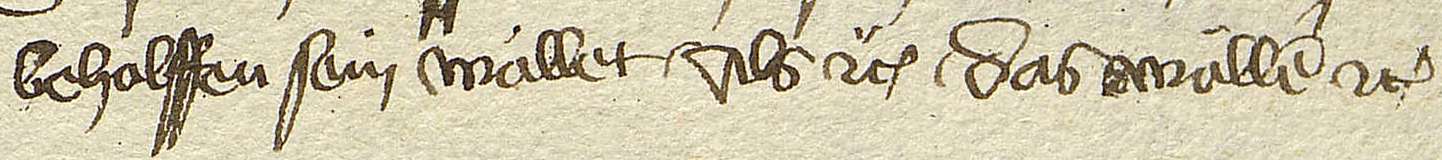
beholffen ſein wöllet / Als ec* / Das wölle* ec*
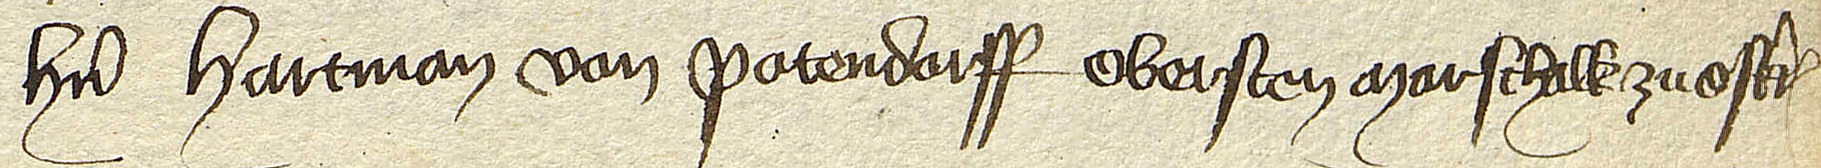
hn* hartman von Potendorff Oberſten Marſchalk cʒu Oſtr*
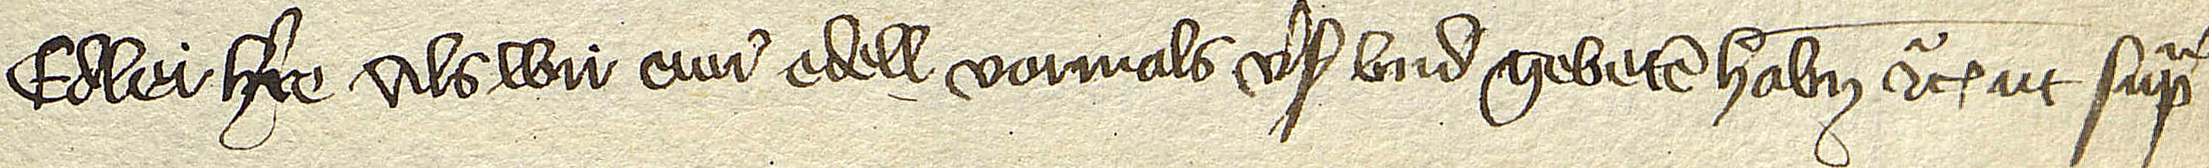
Edler h*re / Als wir ewr* edell vormals v*ſ* vnd gebete* habn* ec* ut ſup*
